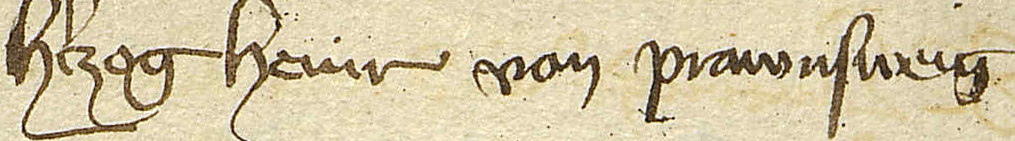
h*cʒog heinr* von prawnſweig
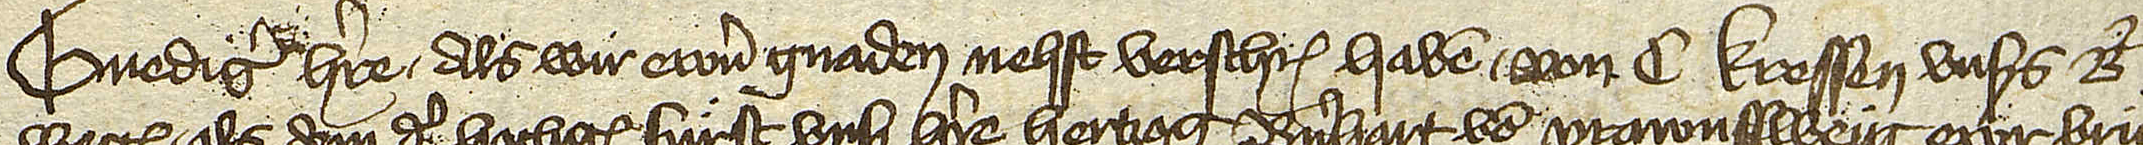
Gnedig* h*re / Als wir ewn* gnaden nehſt verſchr* habe / von C Kreſſen vnſ*s B*
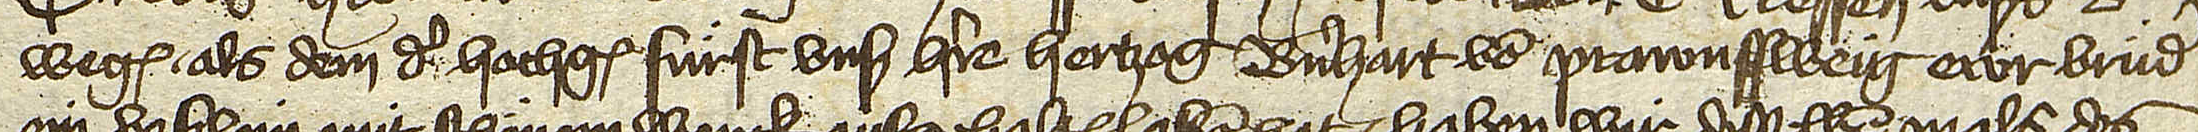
weg* / als dem d* hochg* fürſt vnſ* h*re hertʒog Bn*hart vo* prawnſſweig ewr brüd*
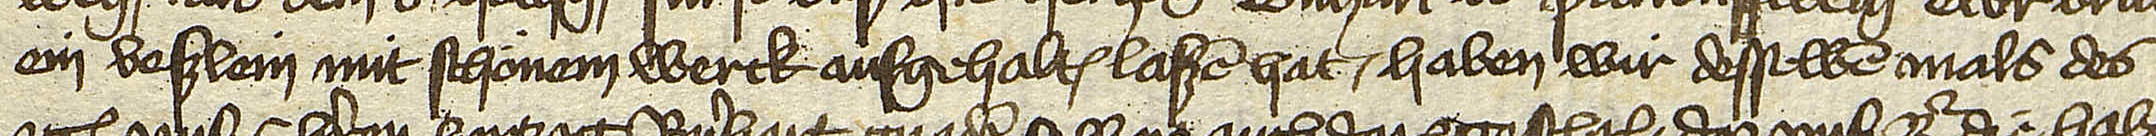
ein veſʒlein mit ſchönem werck aufgehalt* laſʒe* hat / haben wir deſſelbe* mals des
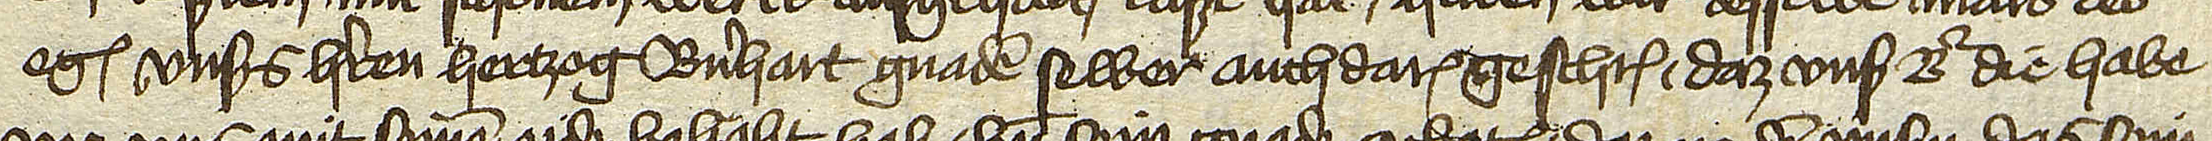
eg* vnſ*s h*ren hertʒog Bn*hart gnade* ſelber auch dar* geſchr* / daʒ vnſ* B* die habe
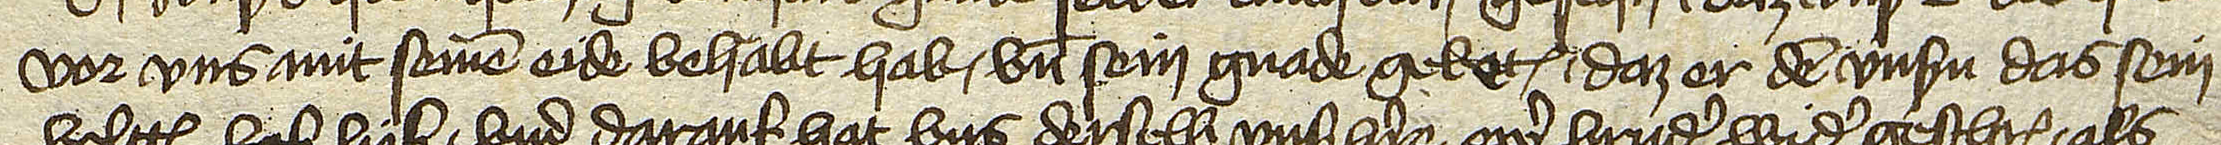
vor vns mit ſeine* eide behabt hab / vn* ſein gnade gebet* / daʒ er de* vnſ*n das ſein
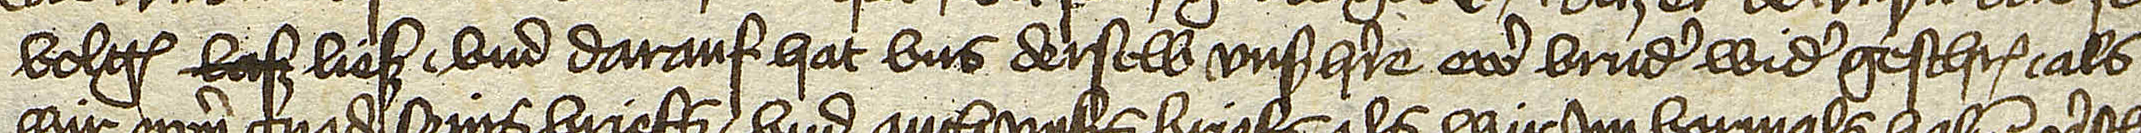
volg* laſʒ lieſʒ / vnd darauf hat vns derſelb vnſ* h*re ew* brud* wid* geſchr* / als
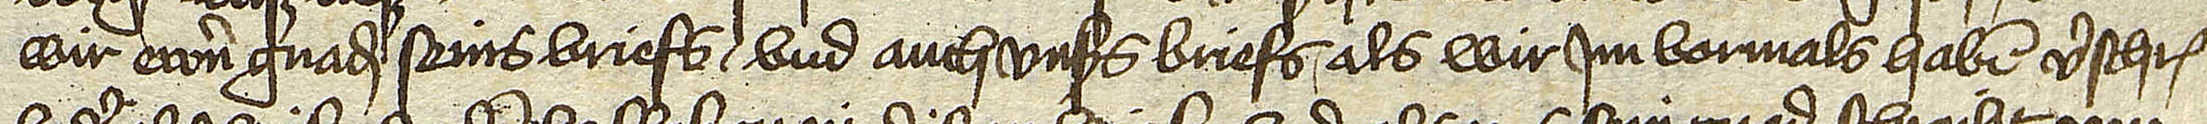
wir ewn* gnad* ſeins briefs / vnd auch vnſ*s briefs / als wir Im vormals habe* v*ſchr*
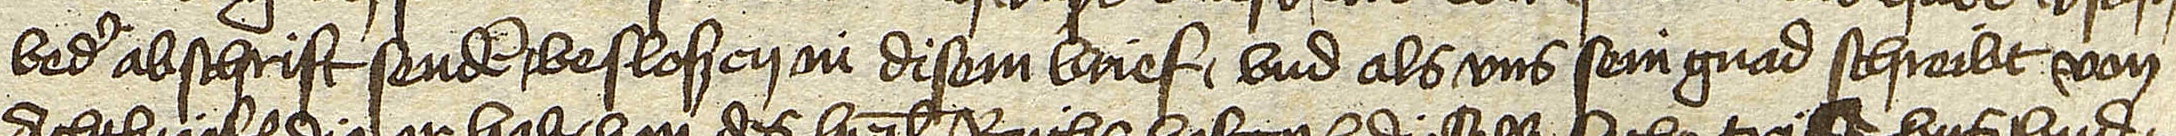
bed* abſchrift ſend* / beſloſʒen in diſem brief / vnd als vns ſein gnad ſchreibt von
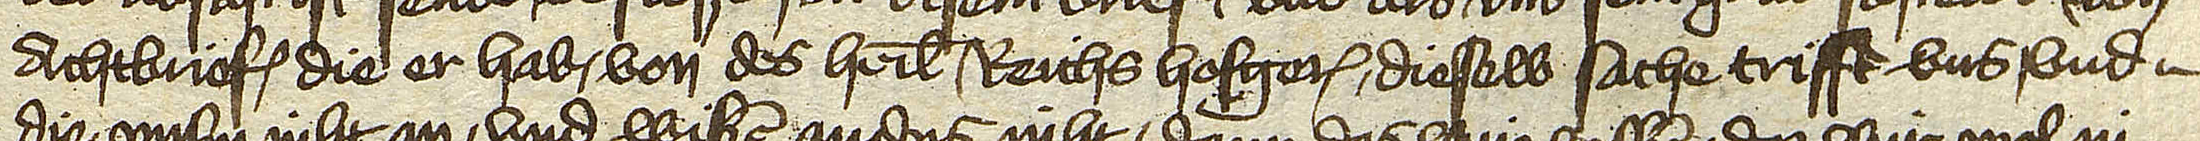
Achtbrief* die er hab / von des heil* Reichs hofger* / dieſelb ſache trifft vns / vnd ~
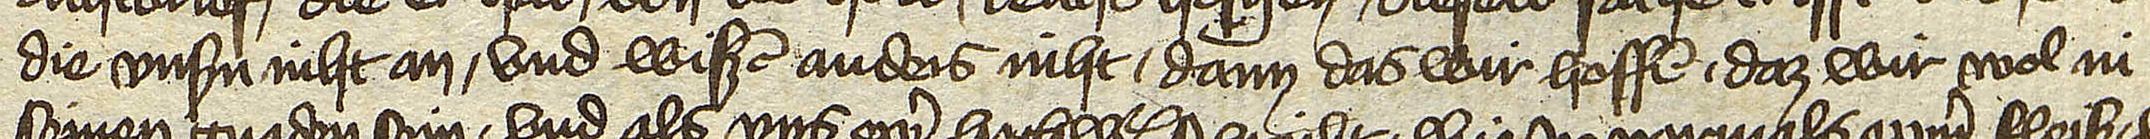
die vnſ*n niht an / vnd wiſʒe* anders niht / dann das wir hoffe* / daʒ wir wol in
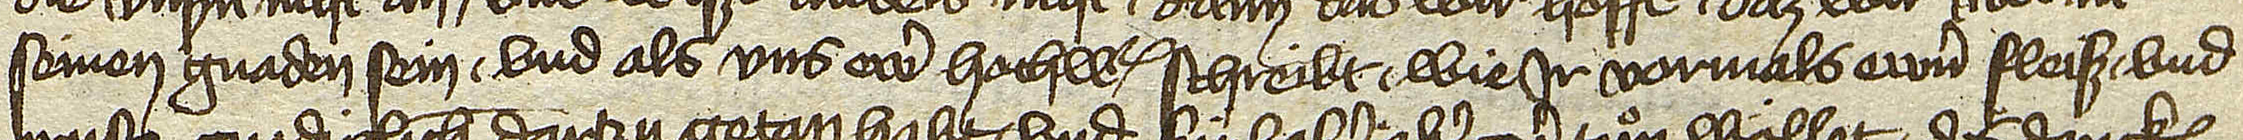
ſeinen gnaden ſein / vnd als vns ew* hochw* ſchreibt / wie Ir vormals ewn* fleiſʒ / vnd
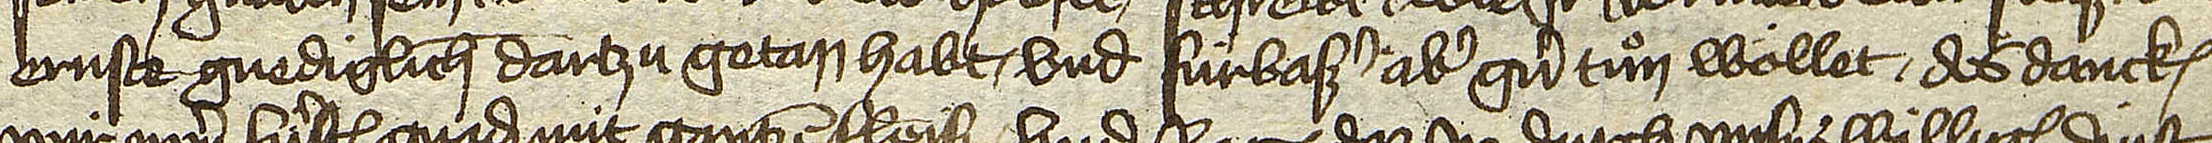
ernſte gnediglich dartʒu getan habt / vnd fürbaſʒ* ab* gn* tün wöllet / des danck*
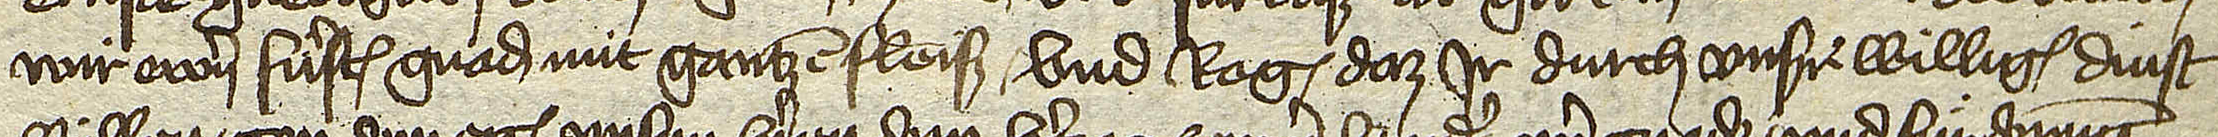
wir ewn* füſt* gnad* mit gantʒe* fleiſʒ / vnd Rog* / daʒ Ir durch vnſ*r willig* dinſt
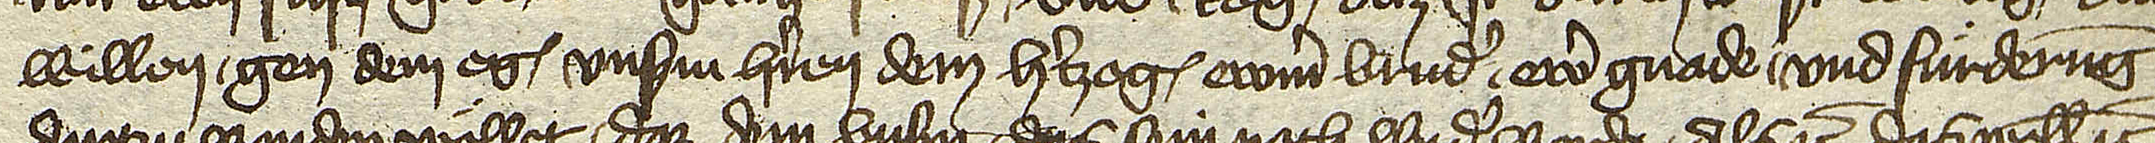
willen / gen dem eg* vnſ*m h*ren dem h*cʒog ewm* brud* / ew* gnade / vnd fürderug*
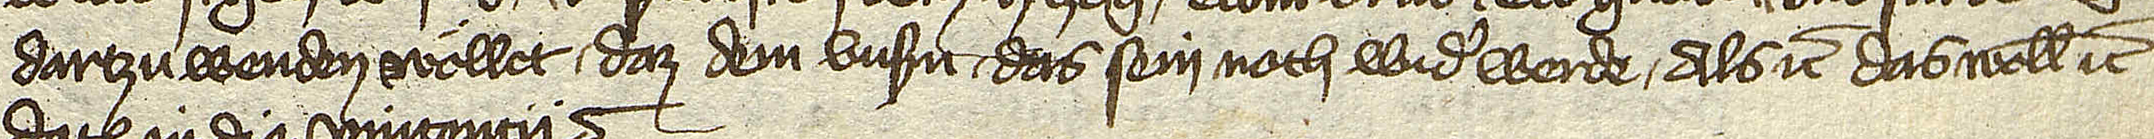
dartʒu wenden wöllet / daʒ dem vnſ*n / das ſein noch wid* werde / Als ec* das woll* ec*
